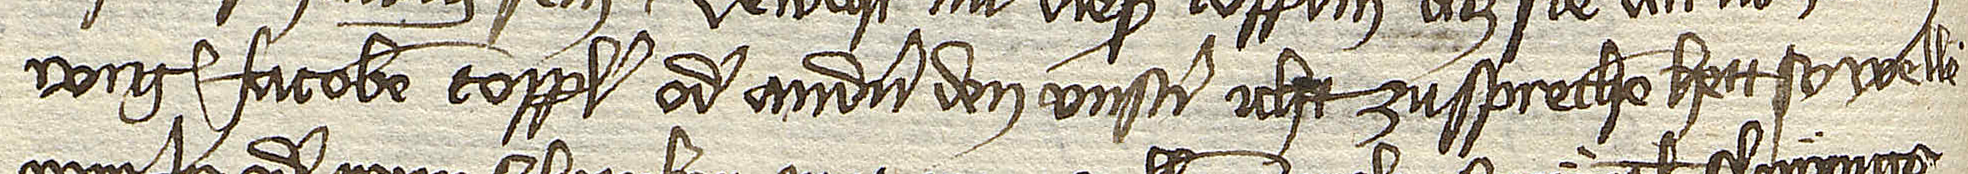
vorg* Iacobe* toppl* od* andn* den vnſn* icht ʒu ſpreche* hett ſo welle*
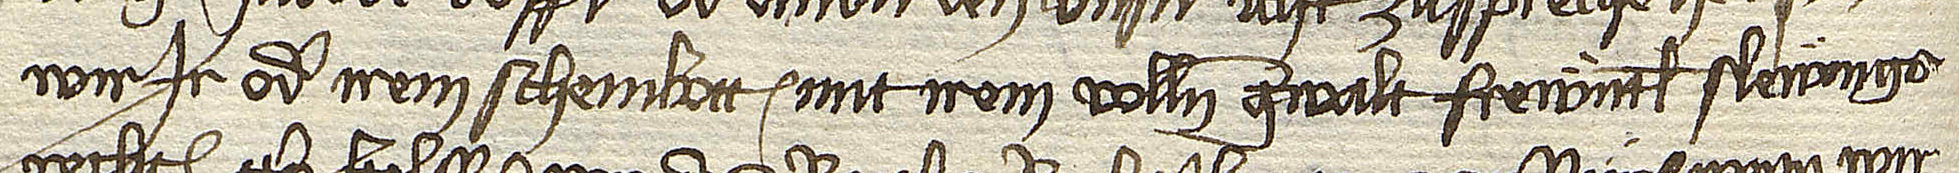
wir Ir od* irem ſcheinbott* mit irem volln* gwalt freẅntl* ſleẅnigs
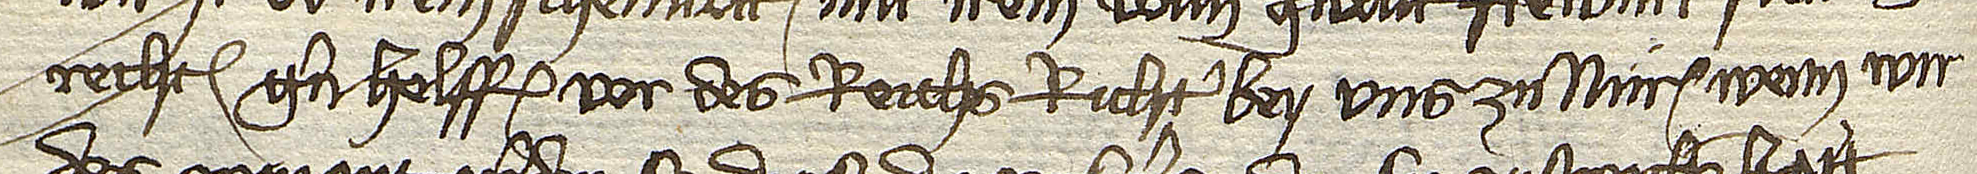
recht* g*n helff* vor des Reichs Richt* bey vns ʒu Nür* wenn wir
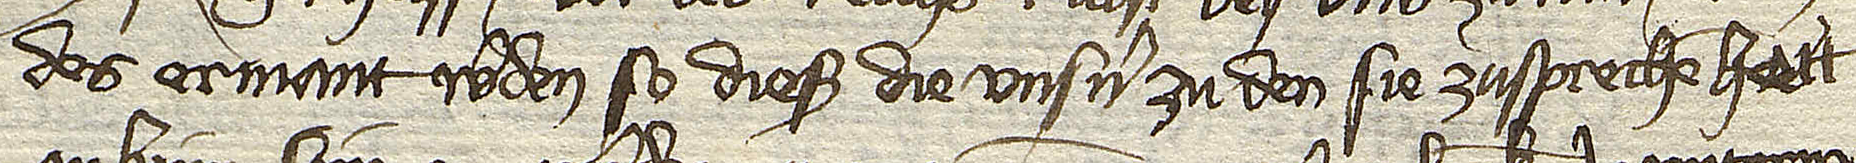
des ermant w*den ſo dieſ* die vnſn* ʒu den ſie ʒuſpreche* hett
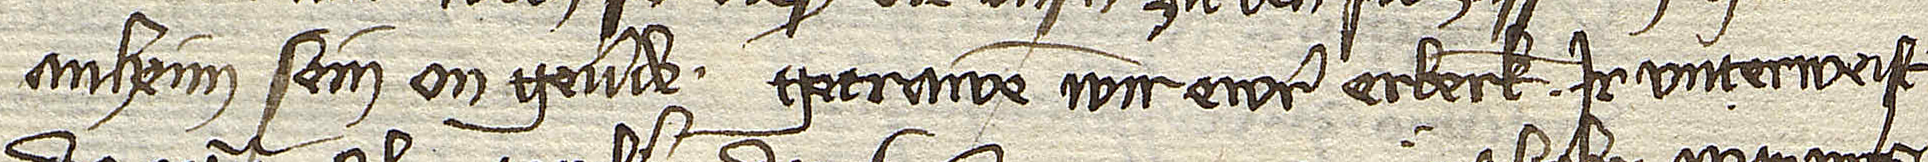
anheim ſein on geu*de . getrawe* wir ewr* erberk* . Ir vnterweiſt
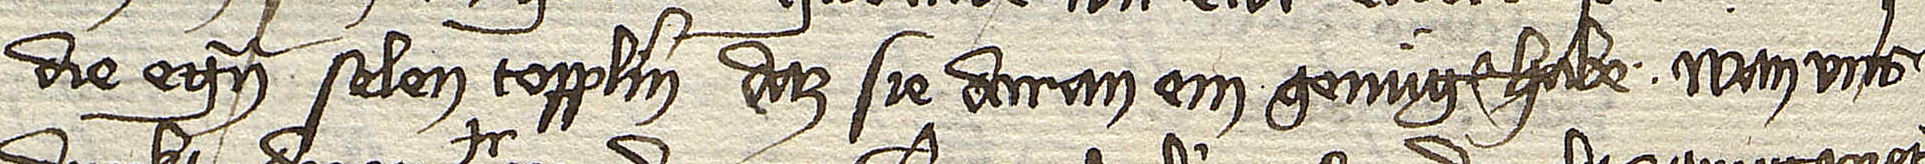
die egn* ſelen toppl*in daʒ ſie daran ein genüg* habe . wan vns
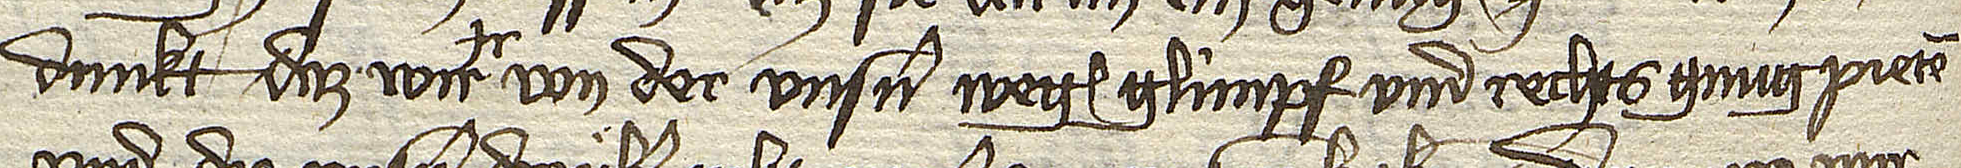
dunkt / daʒ wir von der vnſn* weg* glimpf vnd rechts gnug piete*
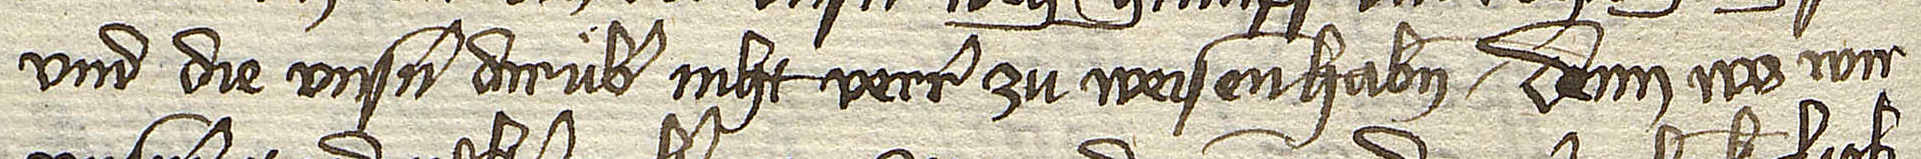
vnd die vnſn* darüb* niht verr* ʒu weiſen habn* / Denn wo wir
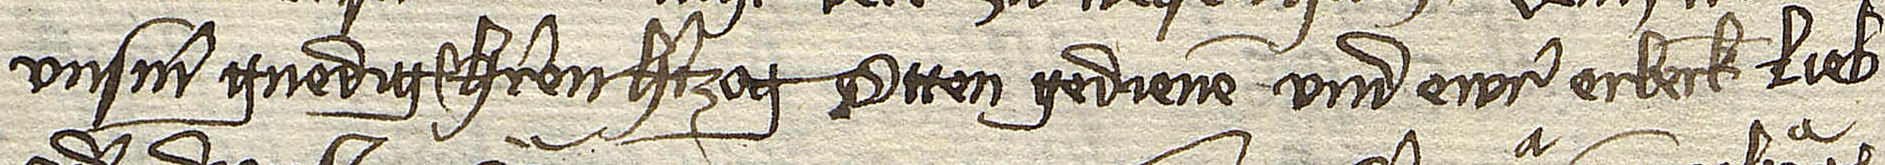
vnſm* gnedig* h*ren h*cʒog Otten gediene* vnd ewr* erberk* lieb
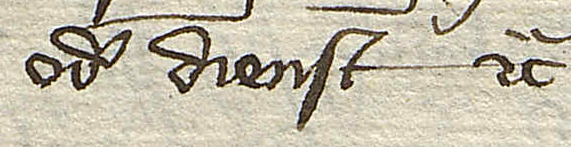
od* dienſt ec*
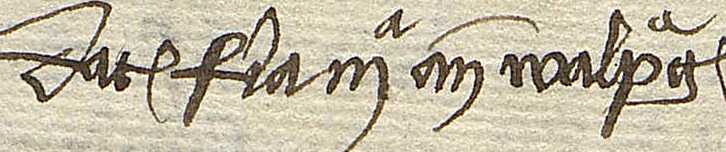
Dat* fi*a iii* an* walp*g*
